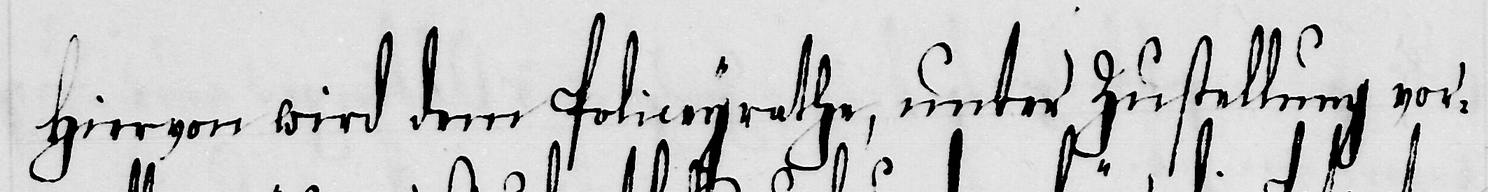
Hiervon wird dem Policeyrathe, unter Zustellung vor¬
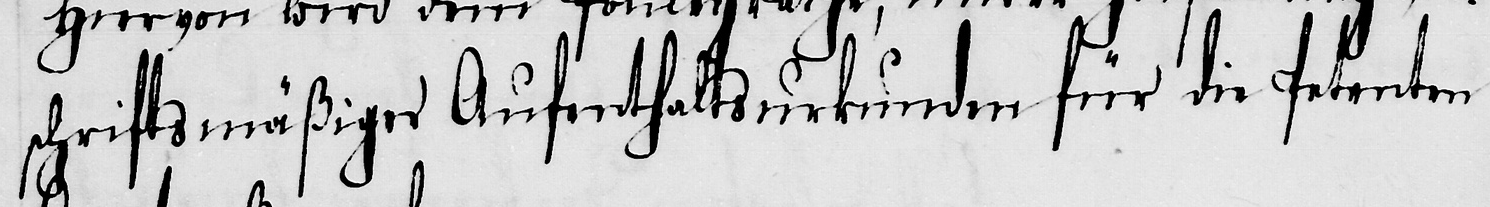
schriftsmäßiger Aufenthaltsurkunden für die Petenten
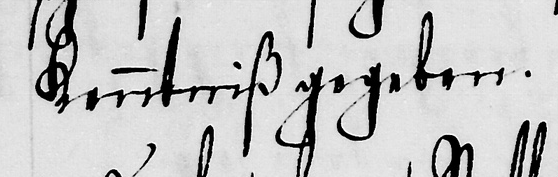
Kenntniß gegeben.
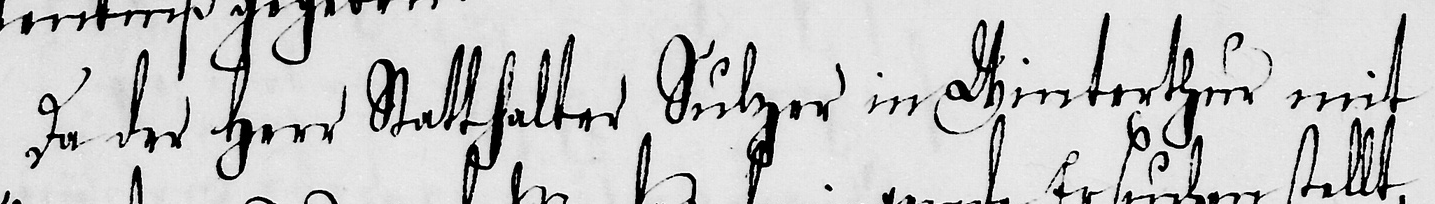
Da der Herr Statthalter Sulzer in Winterthur mit
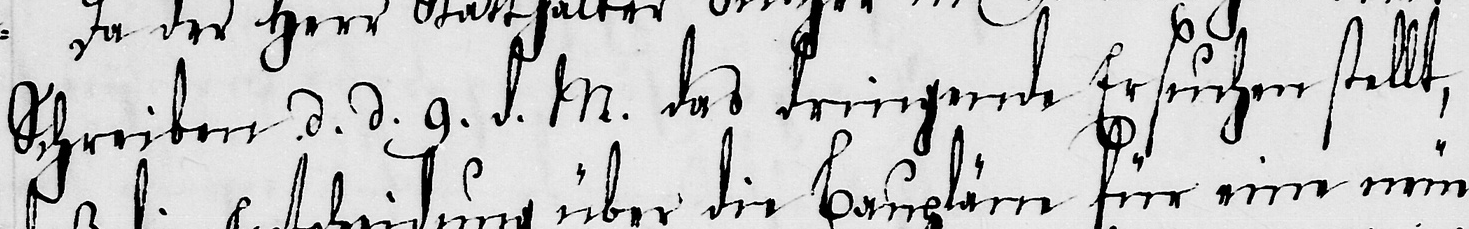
Schreiben d. d. 9. d. M. das dringende Ersuchen stellt,
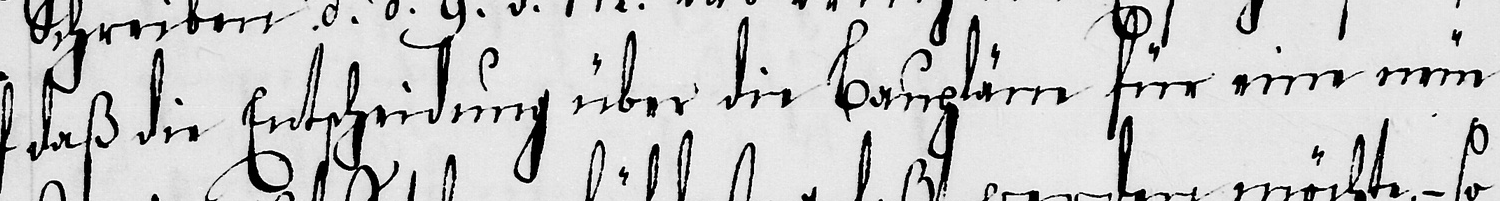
daß die Entscheidung über die Baupläne für eine neue
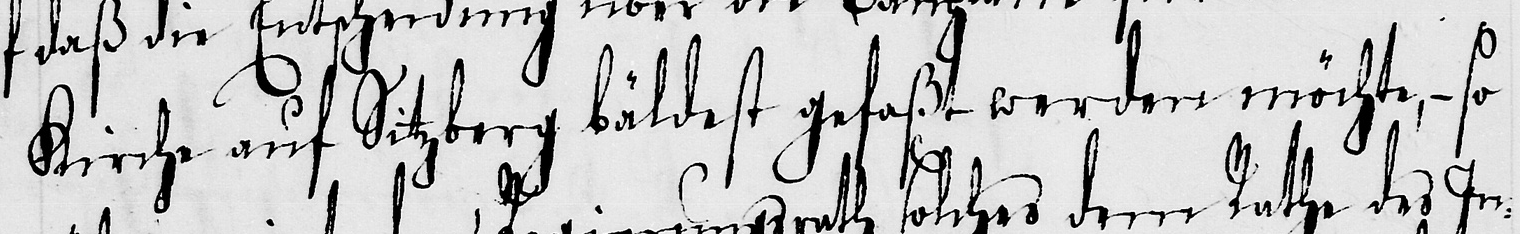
Kirche auf Sitzberg bäldest gefaßt werden möchte, –
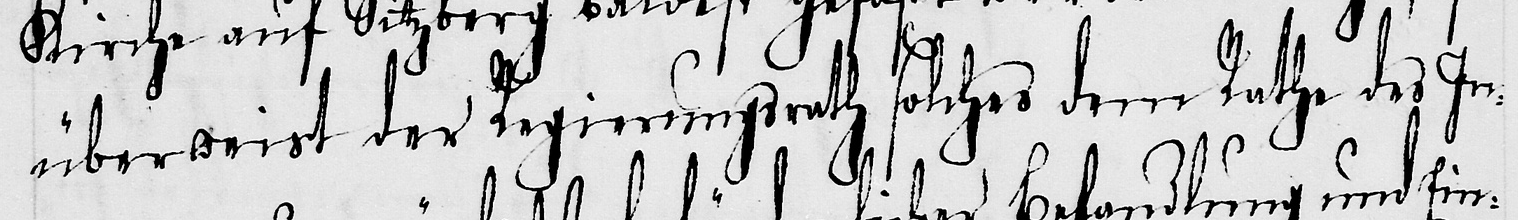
überweist der Regierungsrath solches dem Rathe des In¬
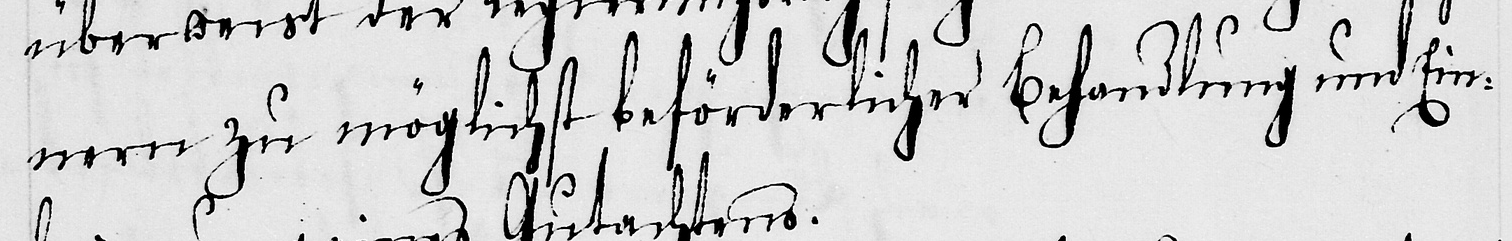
nern zu möglichst beförderlicher Behandlung und Ein¬
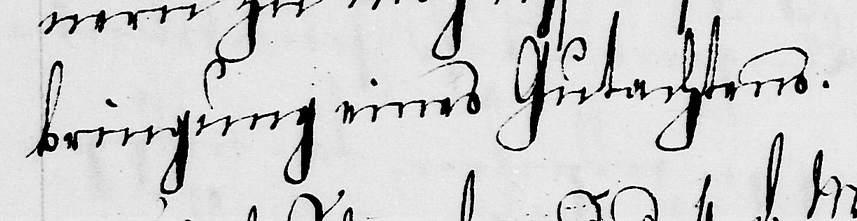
bringung eines Gutachtens.
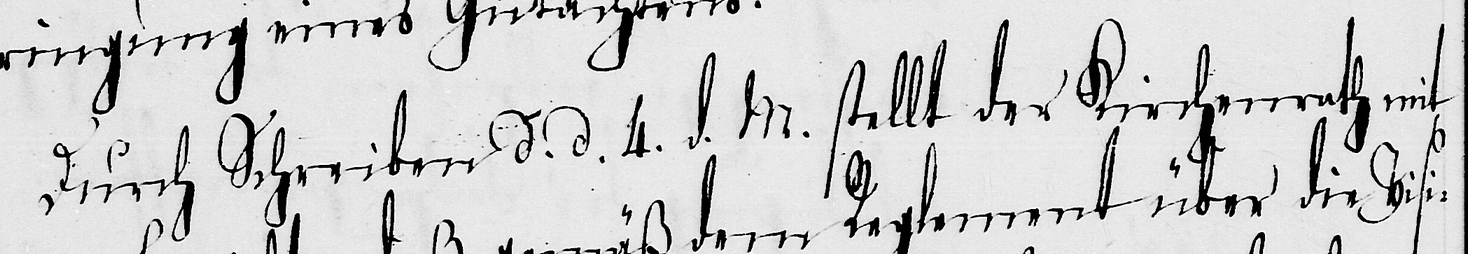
Durch Schreiben d. d. 4. d. M. stellt der Kirchenrath mit
